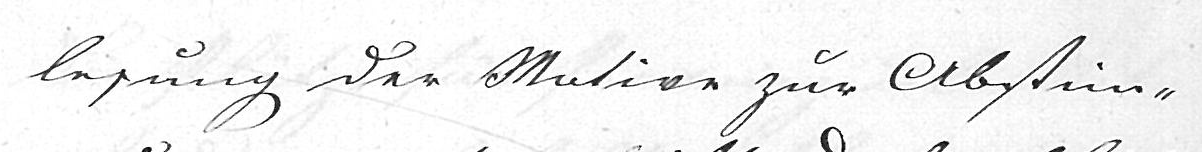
lesung der Motive zur Abstim-
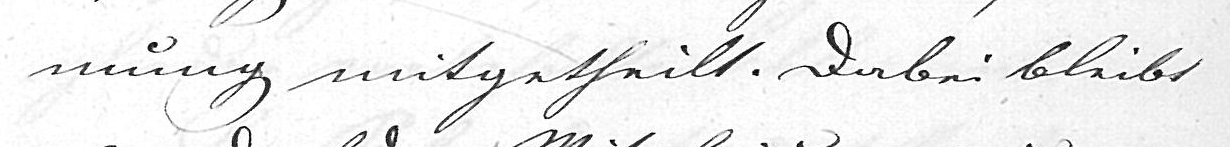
nung mitgetheilt. Dabei bleibt
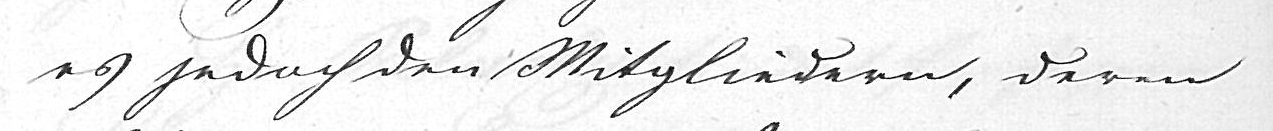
es jedoch den Mitgliedern, deren
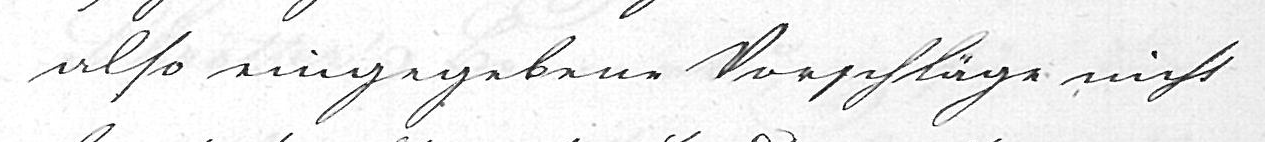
also eingegebene Vorschläge nicht
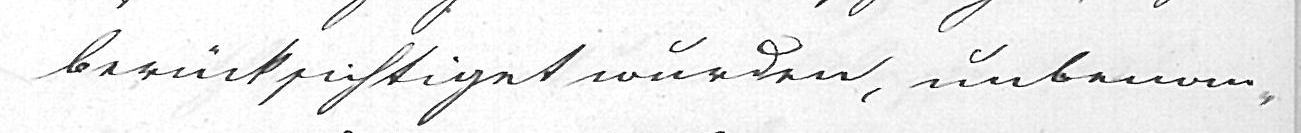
berücksichtiget wurden, unbenom-
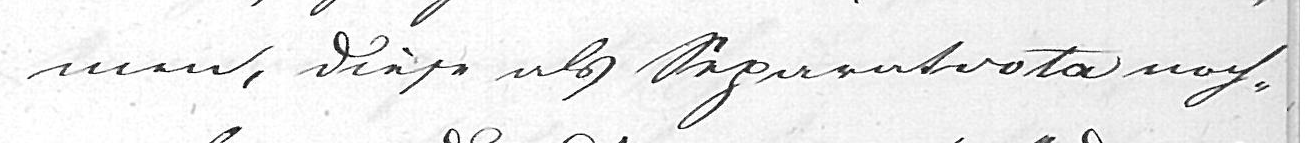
men, diese als Separatvota noch-
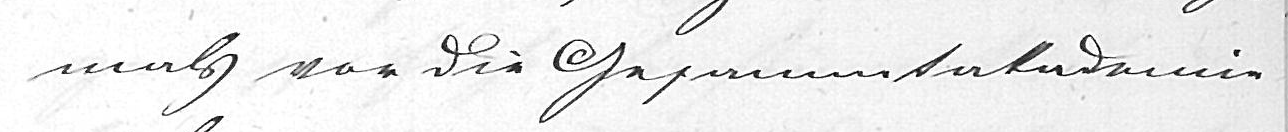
mals vor die Gesammtakademie
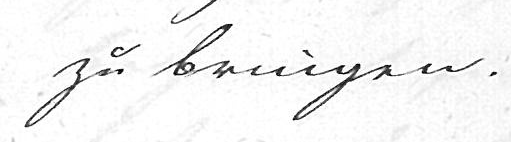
zu bringen.
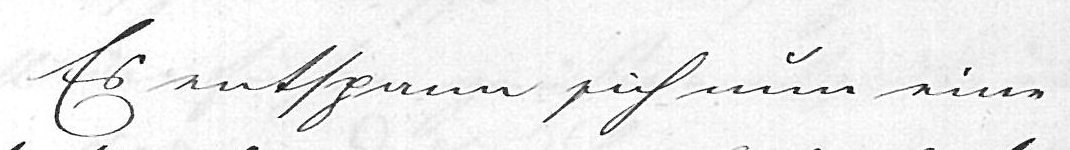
Es entspann sich nun eine
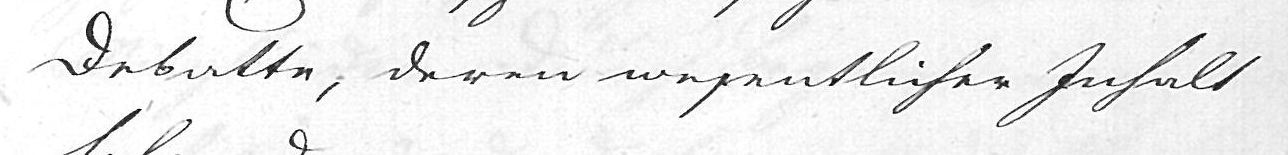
Debatte, deren wesentlicher Inhalt
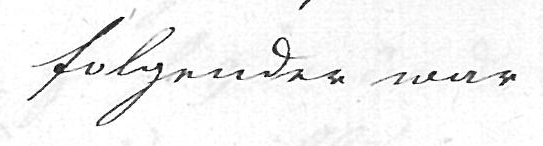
folgender war:
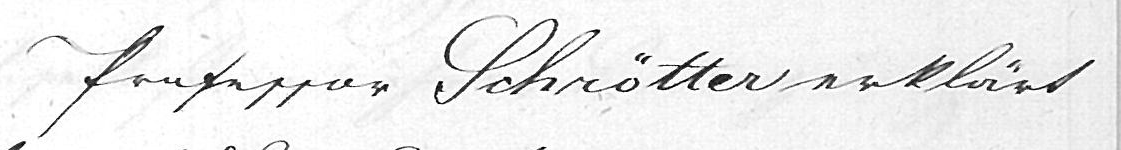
Professor Schrötter erklärt
